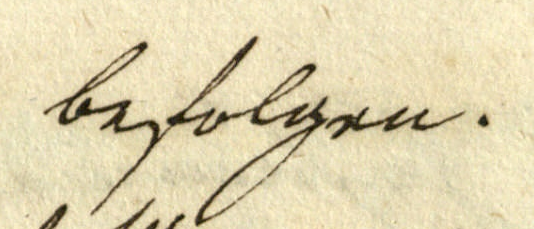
befolgen.
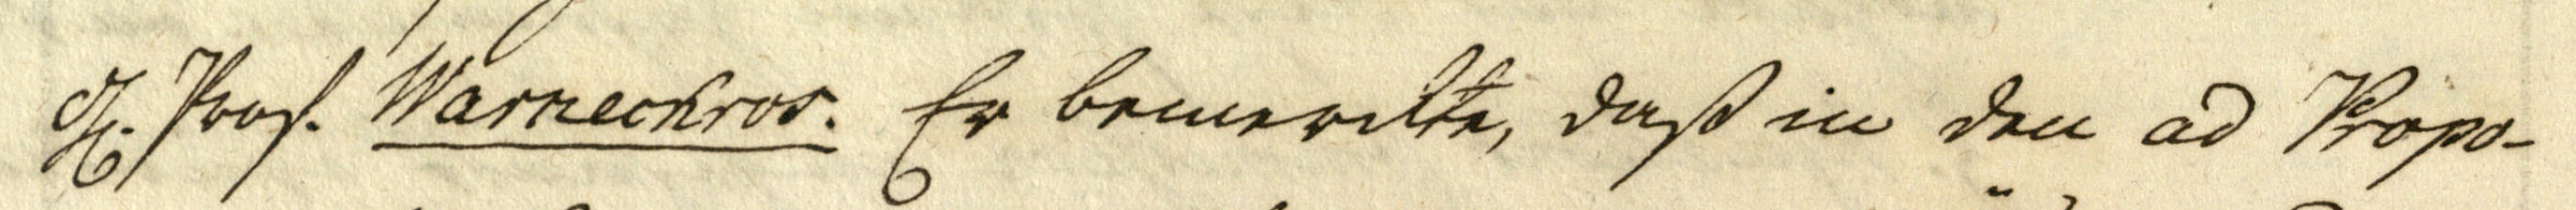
dh. Prof. Warneckros. Er bemerkte, daß in den ad Propo-
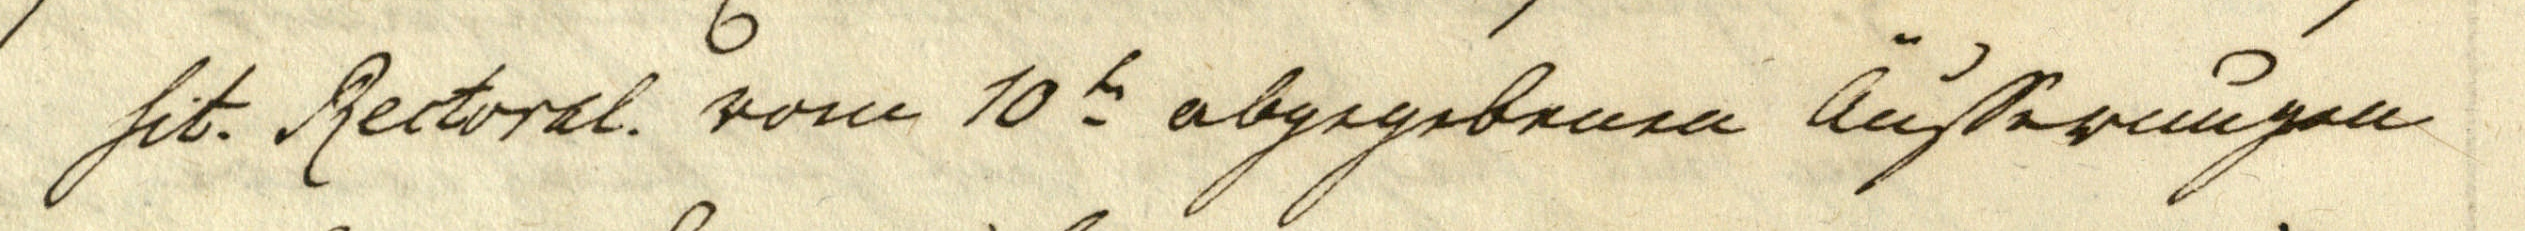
sit. Rectoral. vom 10ten abgegebenen Äusserungen
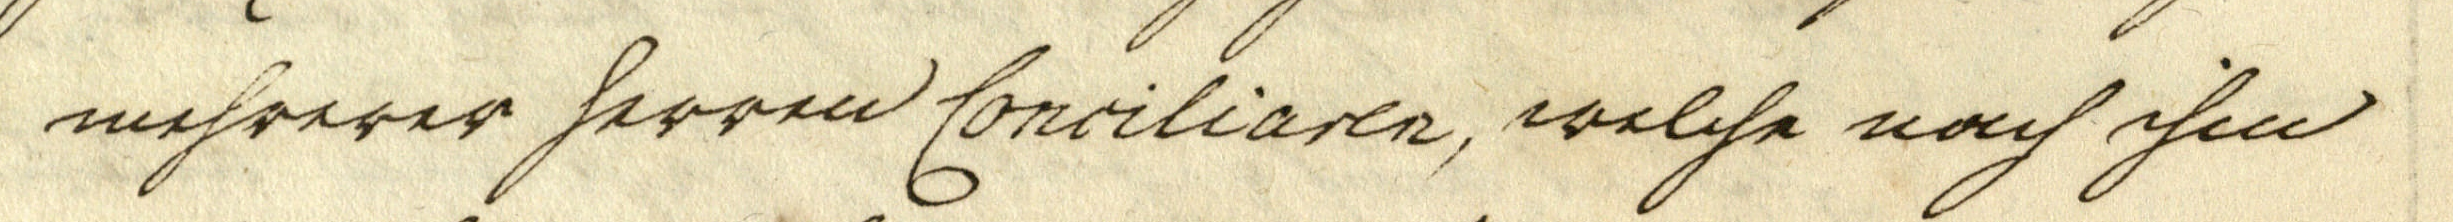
mehrerer Herrn Conciliaren, welche nach ihm
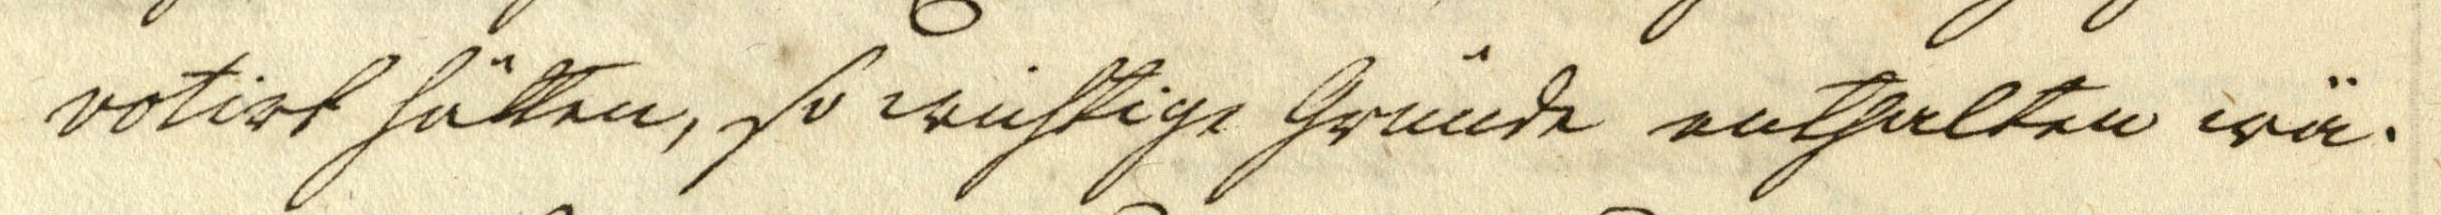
votirt hätten, so wichtige Gründe enthalten wä-
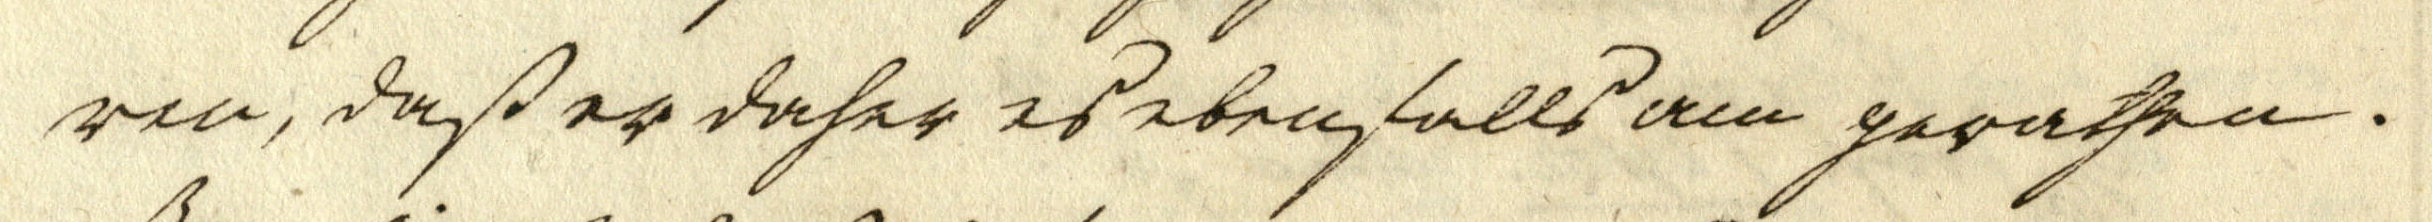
ren, daß er daher es ebenfalls am gerathen-
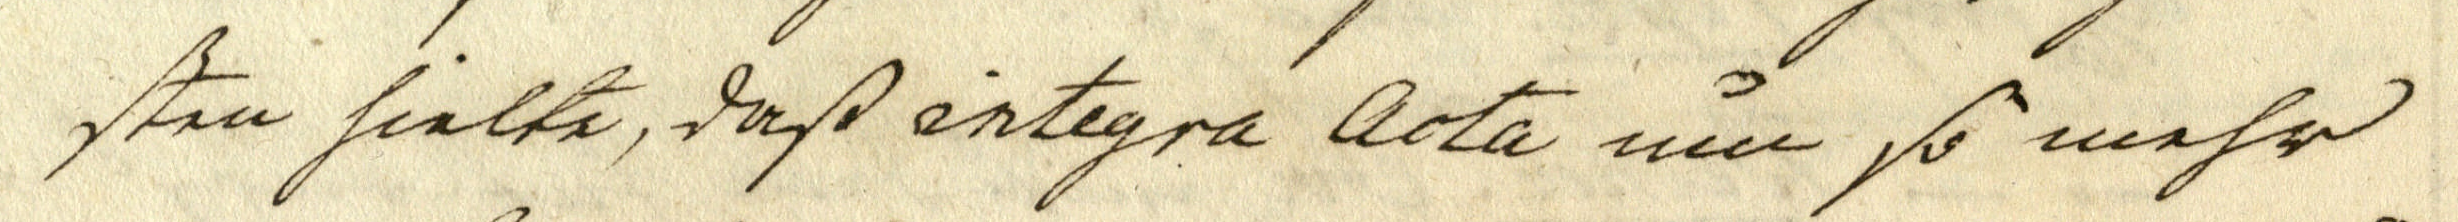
sten hielte, daß integra Acta um so mehr
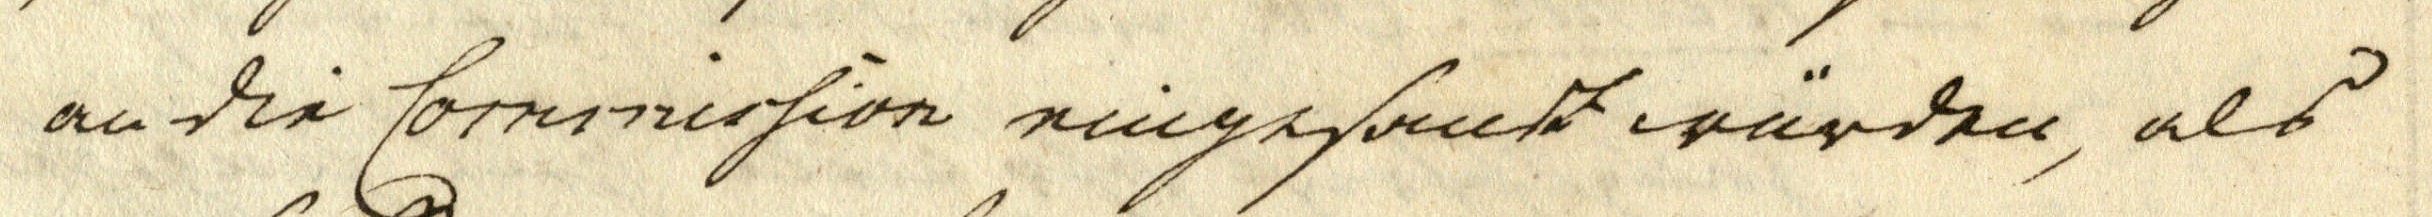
an die Commission eingesandt würden, als
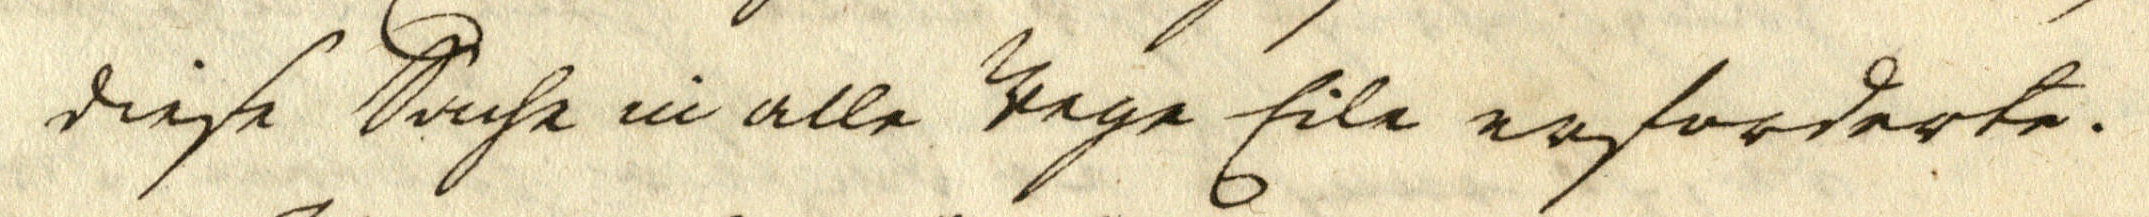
diese Sache in alle Wege Eile erforderte.
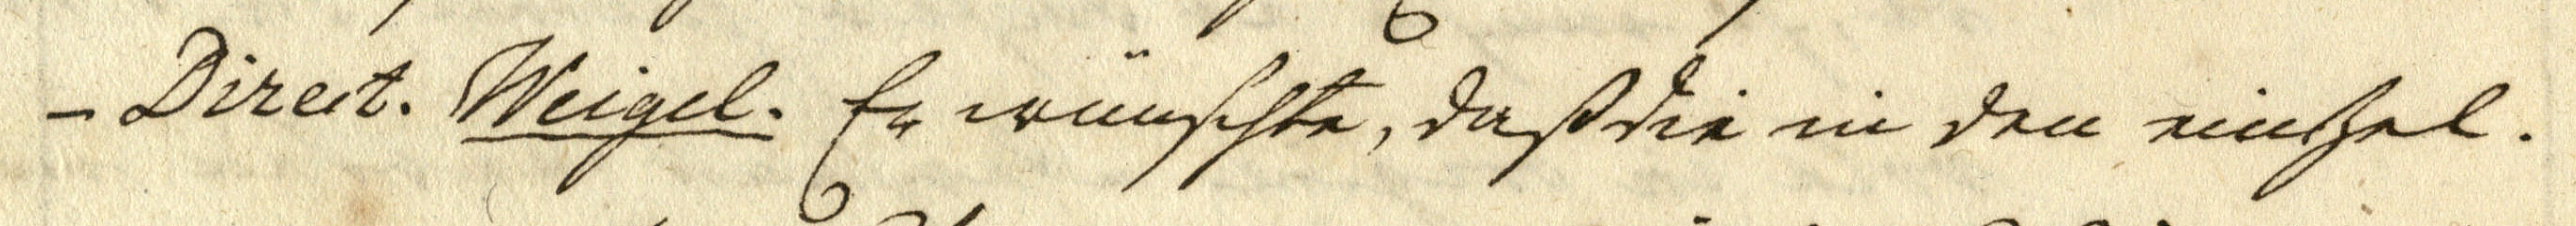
- Direct. Weigel. Er wünschte, daß die in den einzel-
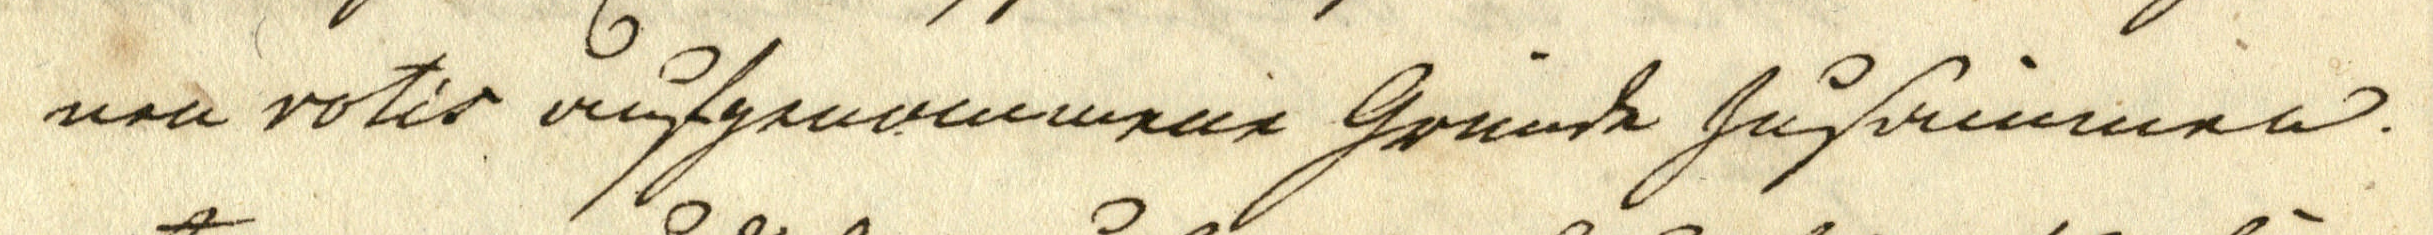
nen votis aufgenommene Gründe zusammen-
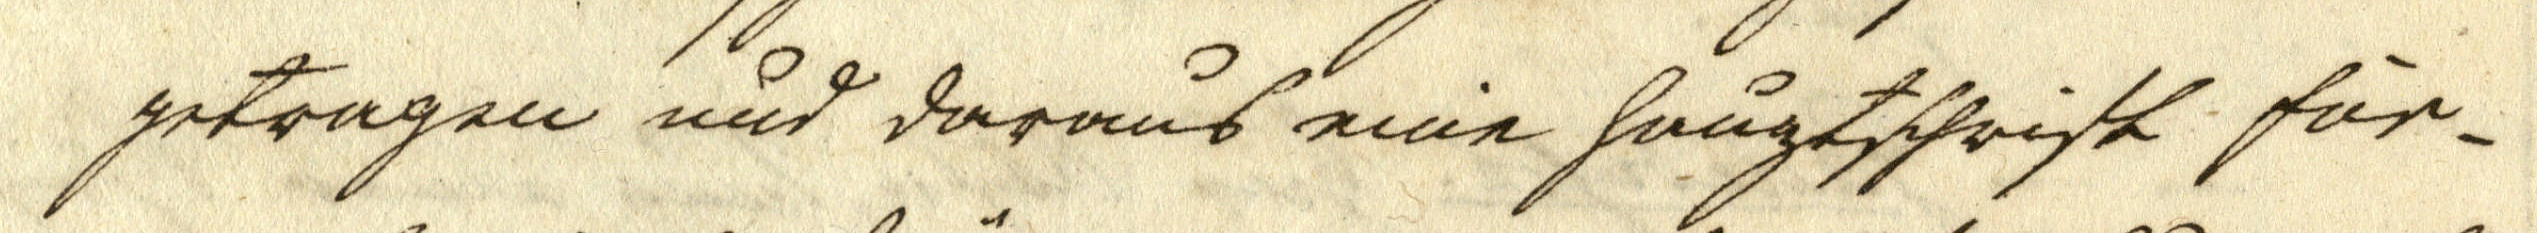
getragen und daraus eine Hauptschrift for-
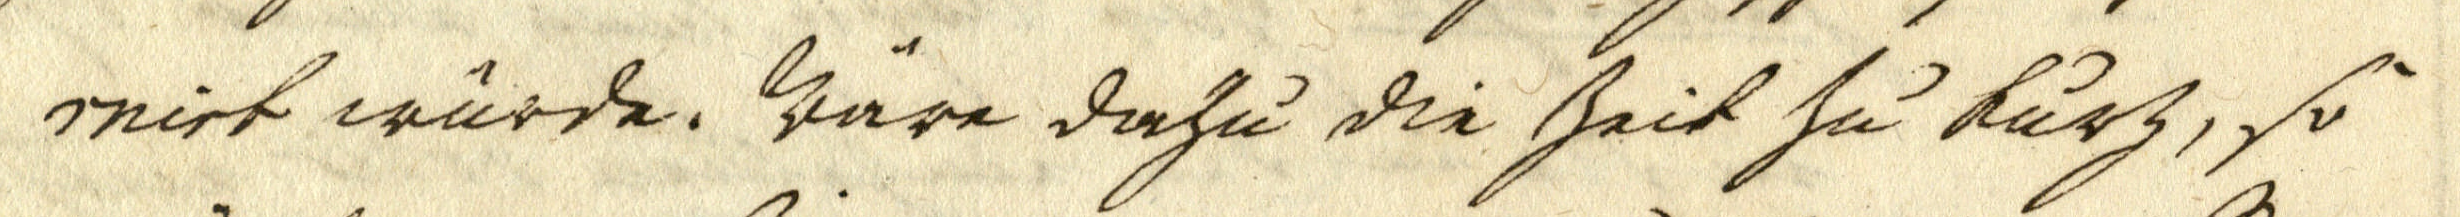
mirt würde. Wäre dazu die Zeit zu kurz, so
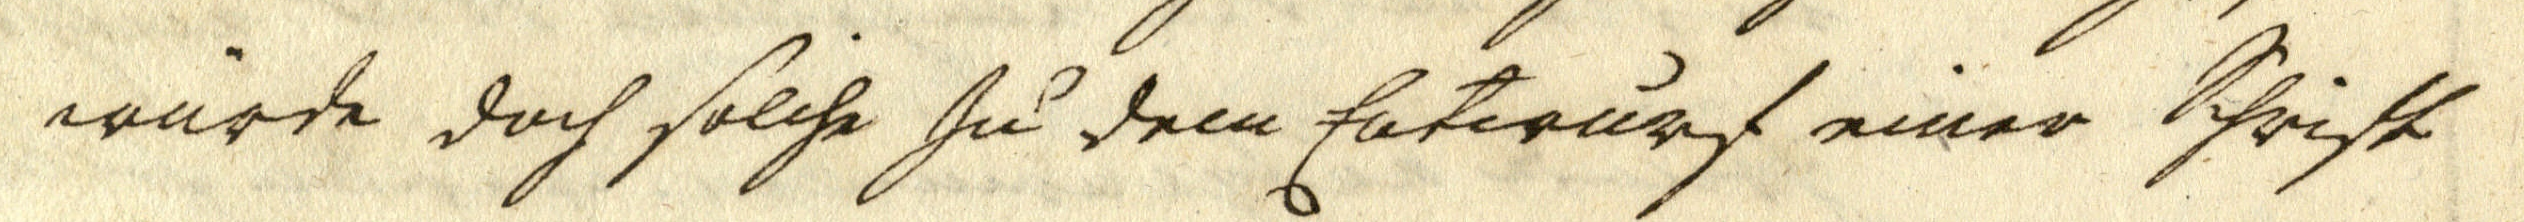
würde doch solche zu dem Entwurf einer Schrift
